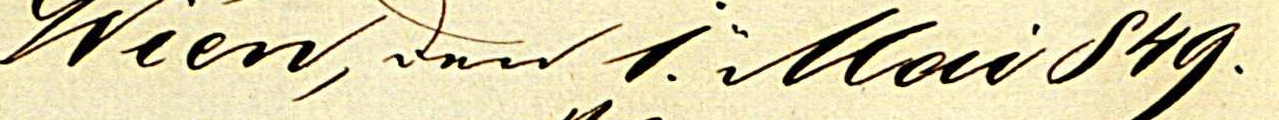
Wien, den 1. Mai 849
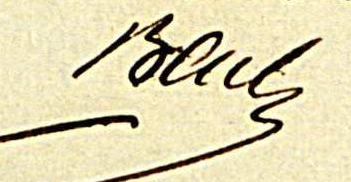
xx
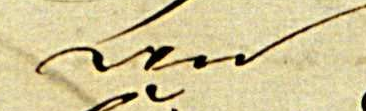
An
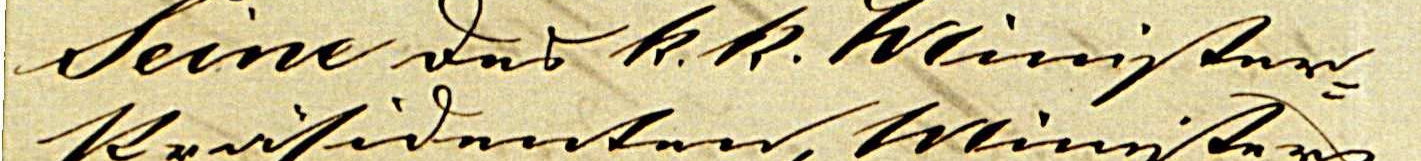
seine des k. k. Minister¬
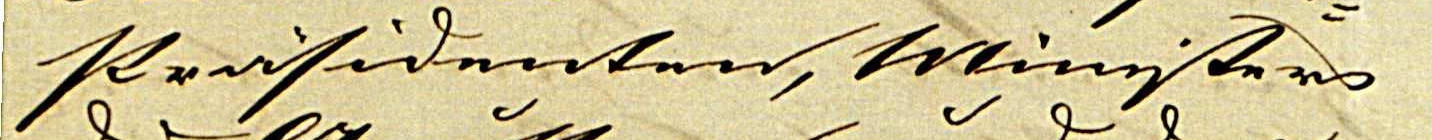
Präsidenten, Ministers
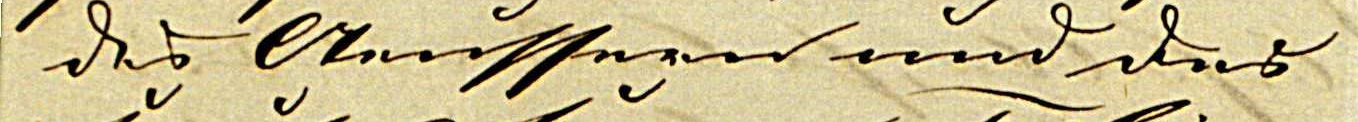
des Aeusern und des
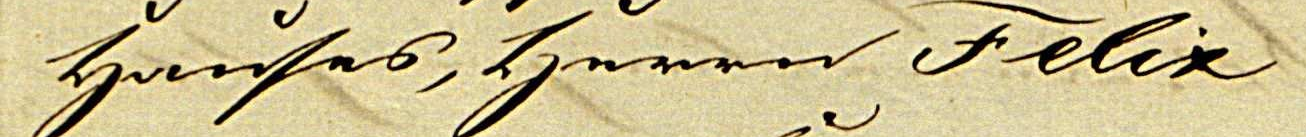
Hauses, Herrn Felix
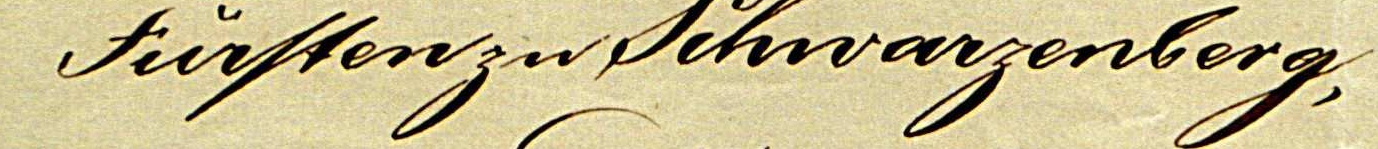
Fürsten zu Schwarzenberg,
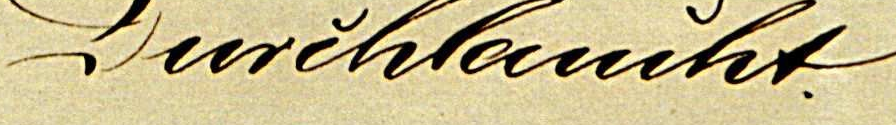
Durchlaucht.
